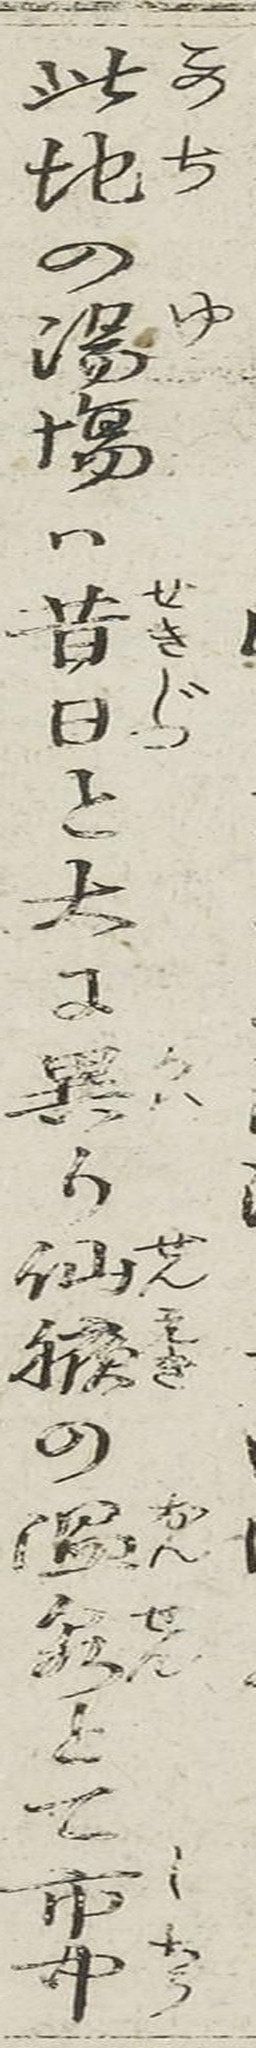此地の湯場は昔日と大に異り仙液の温泉とて市中
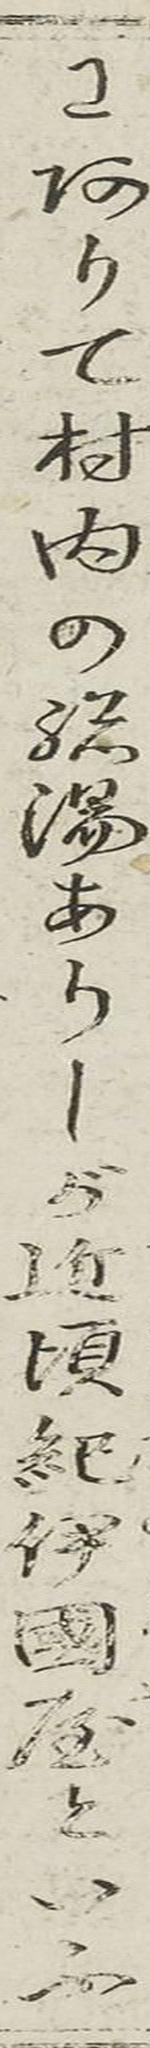にありて村内の総湯ありしが近頃紀伊國屋といふ
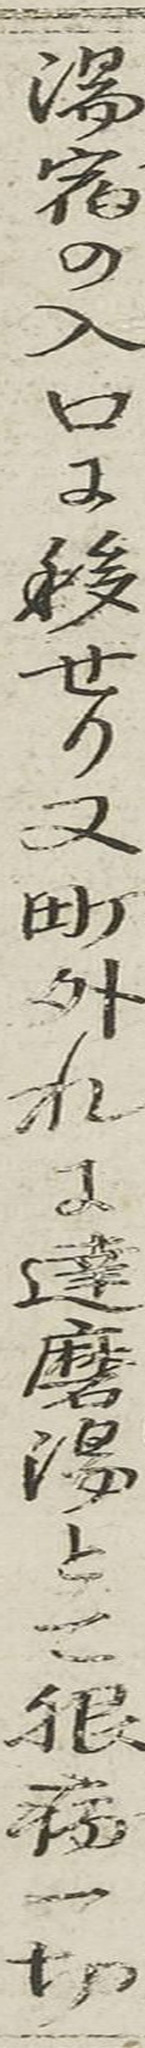湯宿の入口に移せり又町外れに達磨湯とて眼病一切

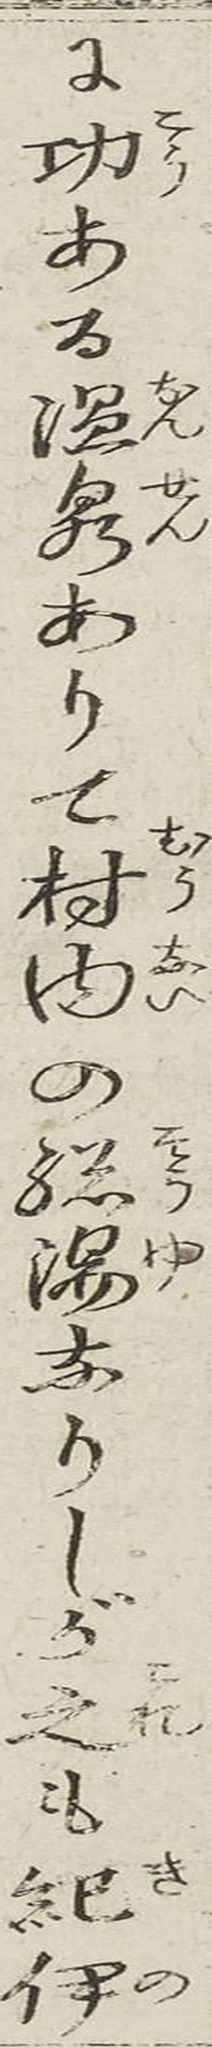に功ある温泉ありて村内の総湯なりしが之も紀伊
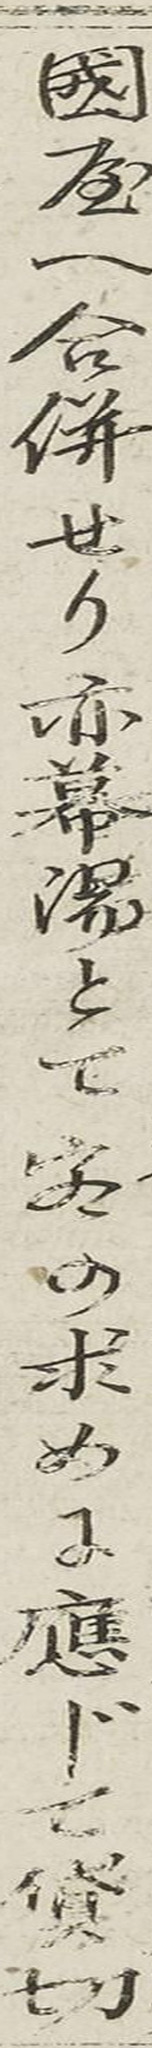國屋へ合併せり亦幕湯とて客の求めに応じて貸切
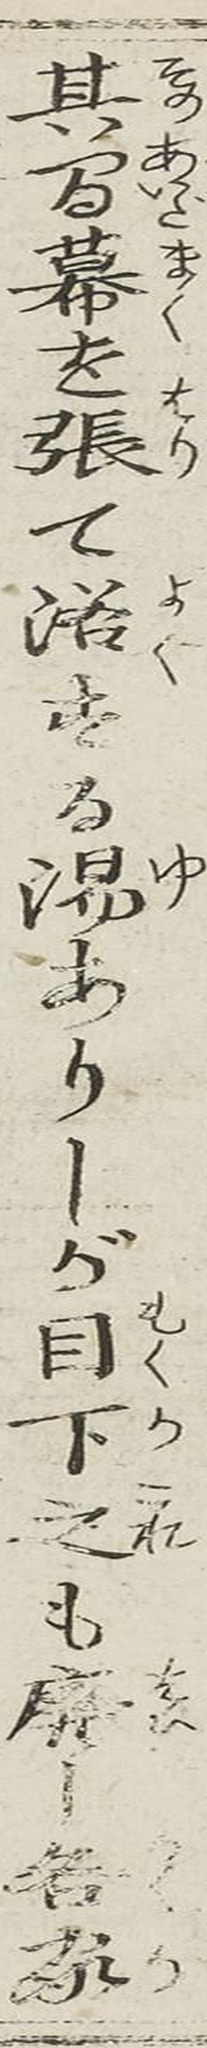其間幕を張て浴する湯ありしが目下之も廃し各家
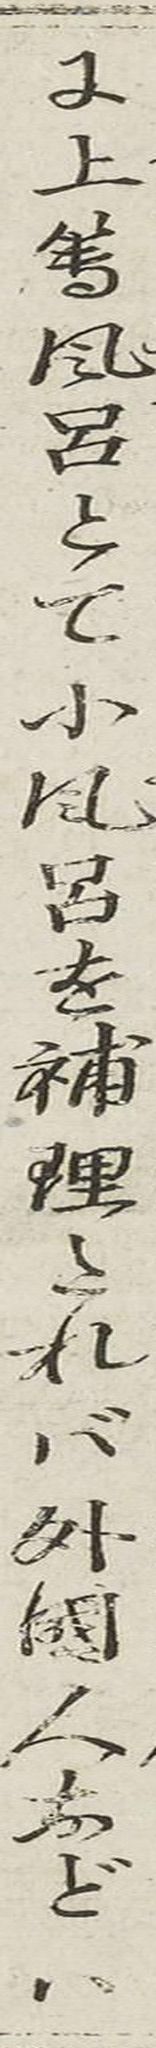に上等風呂とて小風呂を補理たれば外国人などは
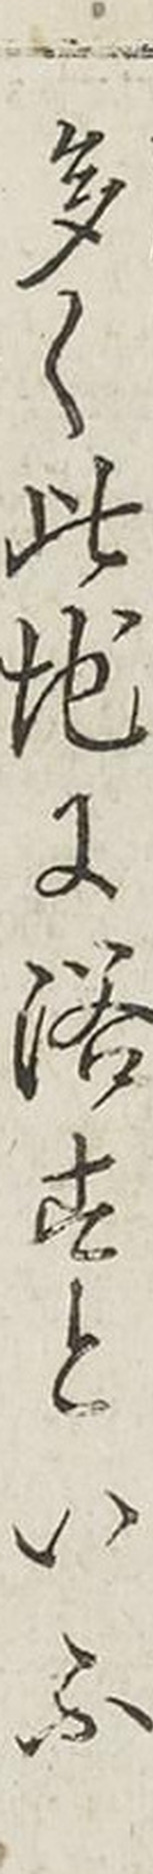多く此地に浴すといふ
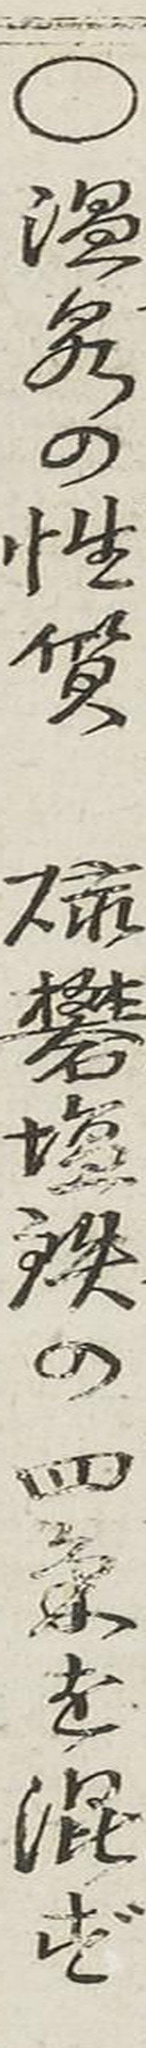○温泉の性質硫礬塩鉄の四氣を混ず
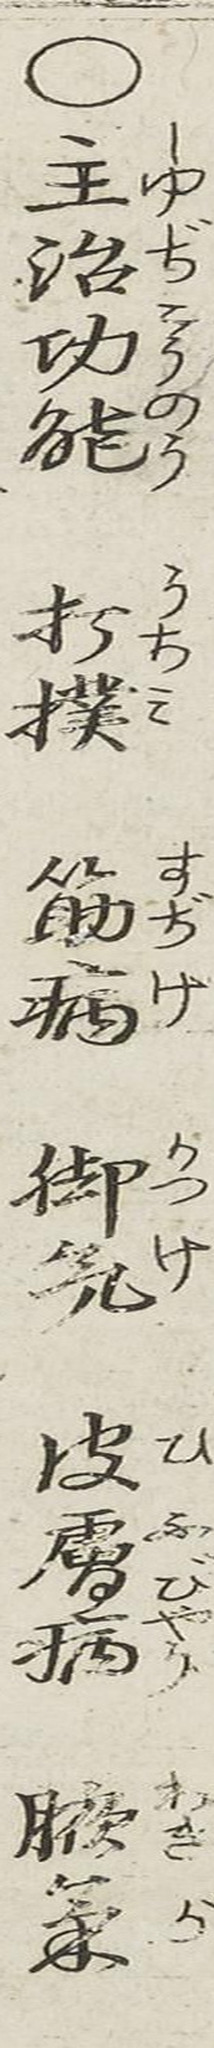○主治功能打撲筋病脚気皮膚病腋氣
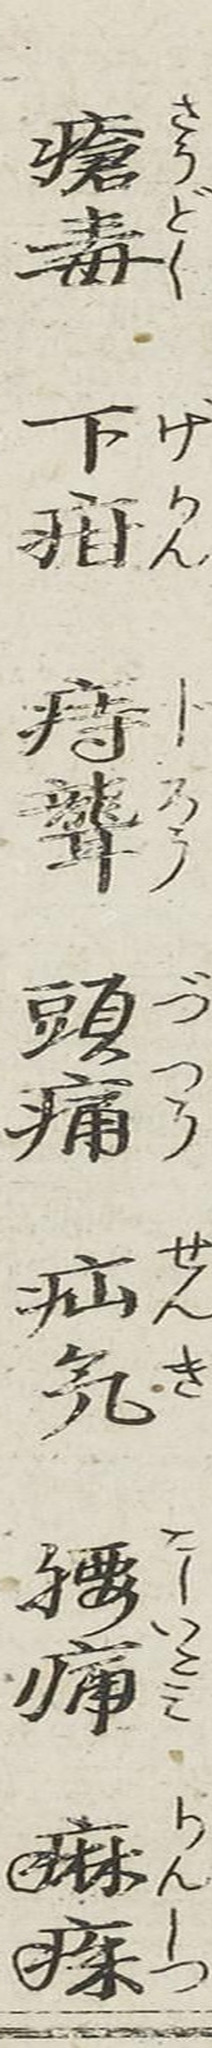瘡毒下疳痔聾頭痛疝気腰痛痳疾
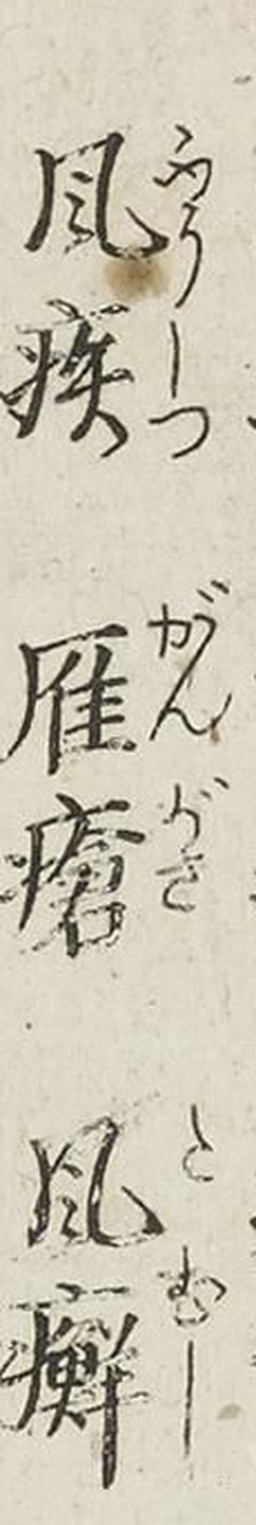風疾雁瘡風癬
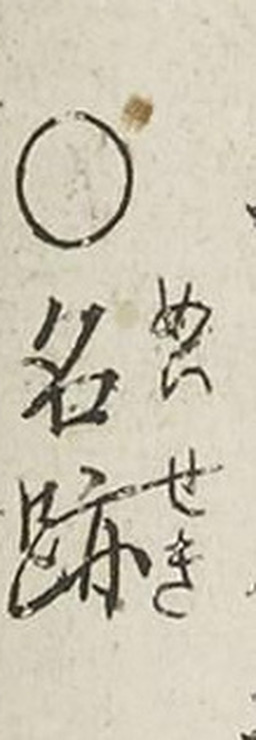○名跡
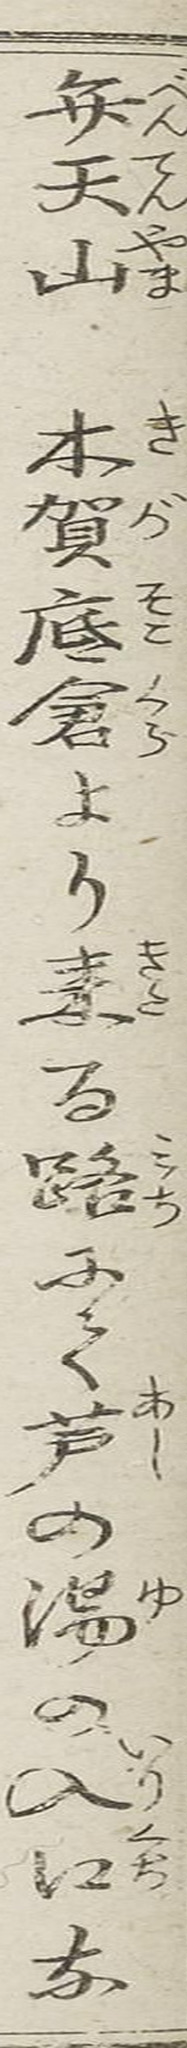弁天山木賀底倉より来る路にて芦の湯の入口な
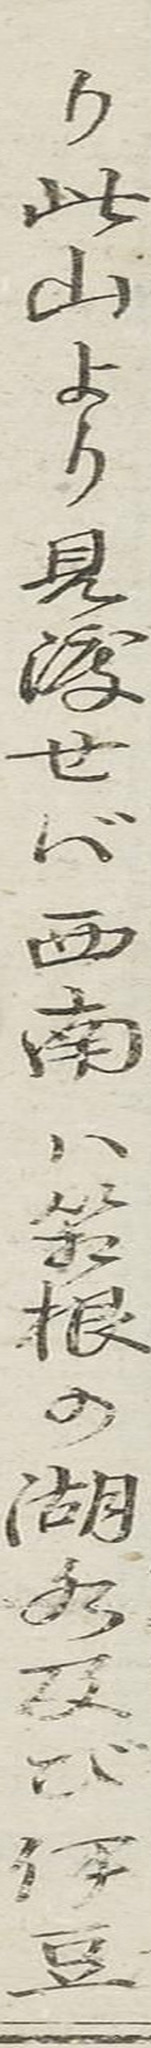り此山より見渡せば西南は箱根の湖水及び伊豆
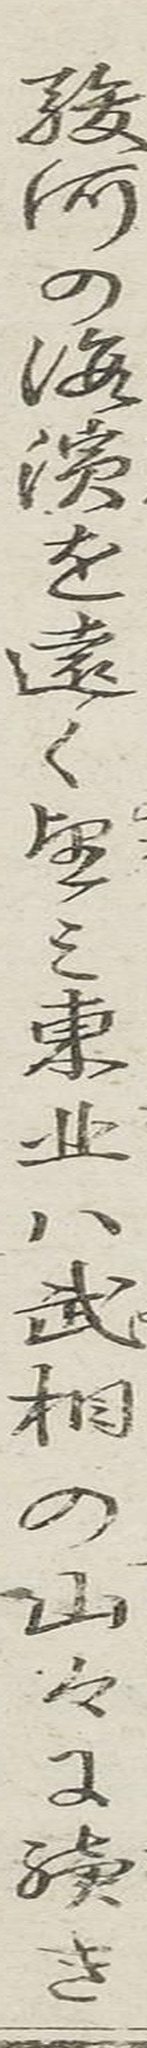駿河の海浜を遠く望み東北は武相の山々に続き
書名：箱根温泉誌　全
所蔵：東京大学地震研究所図書室 Earthquake Research Institute Library, The University of Tokyo, JAPAN
